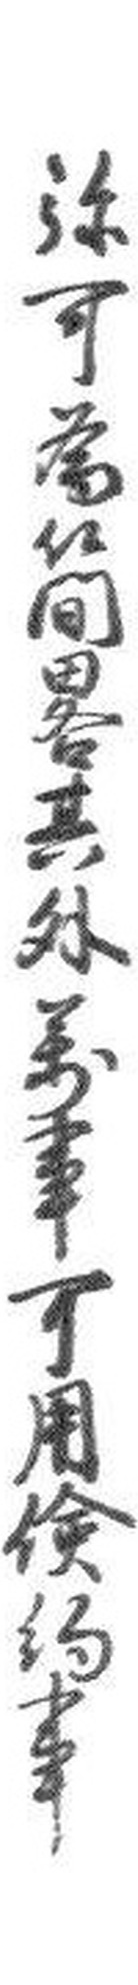弥可為簡略其外万事可用倹約事
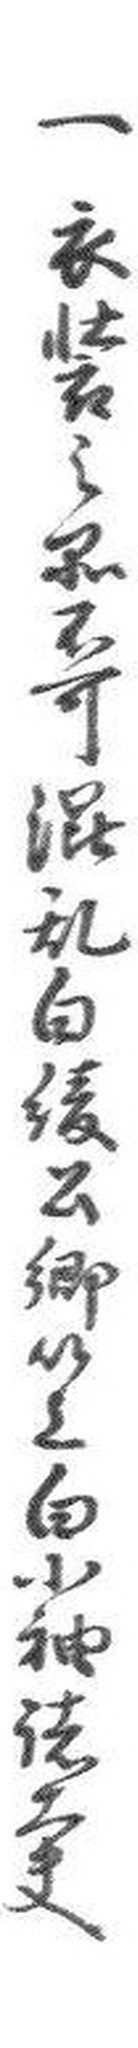一衣装之品不可混乱白綾公卿以上白小袖諸大夫
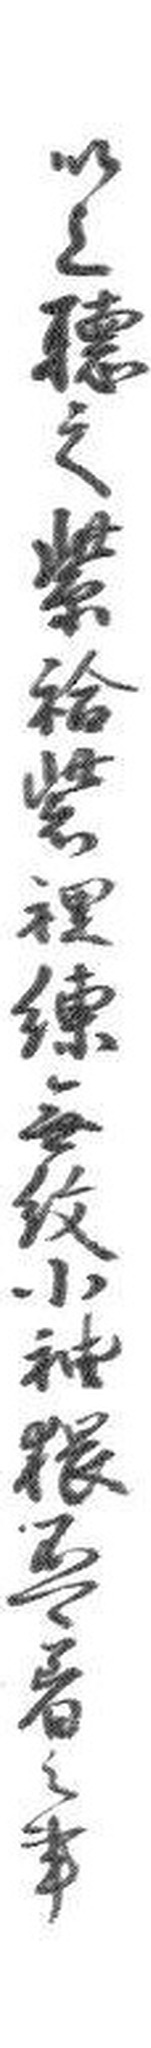以上聴之紫袷紫裡練無紋小袖猥不可着之事
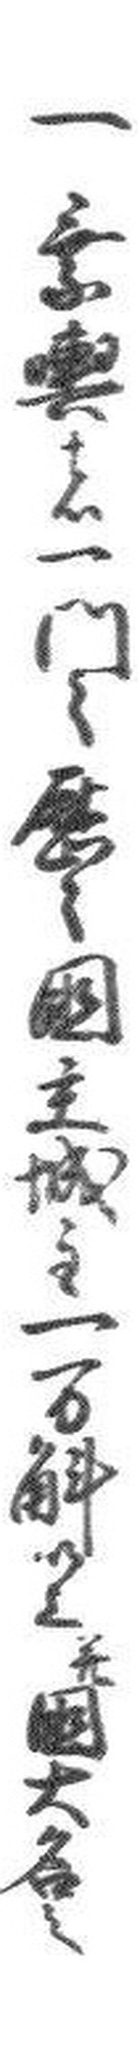一乗輿は一門之歴々国主城主一万斛以上并国大名之
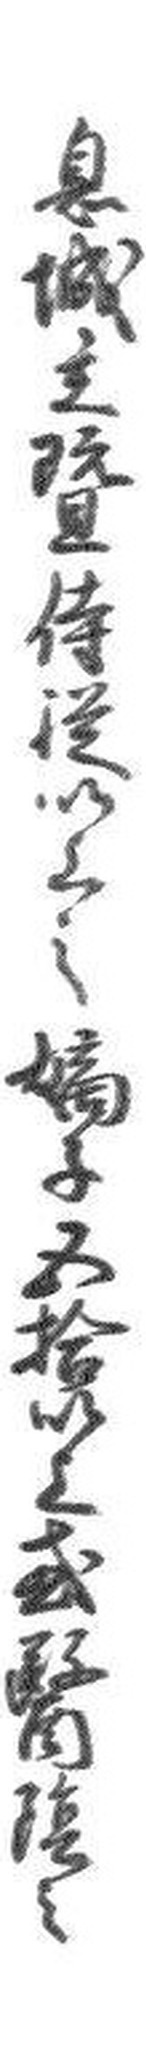息城主曁侍従以上之嫡子五拾以上或医陰之

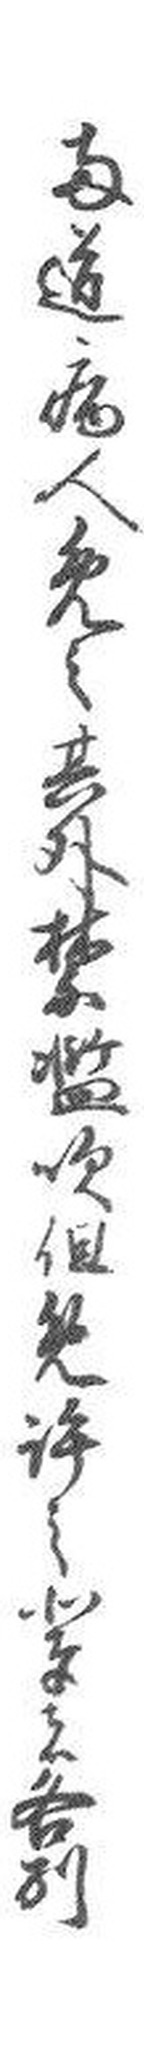両道病人免之其外禁濫吹但免許之輩は各別
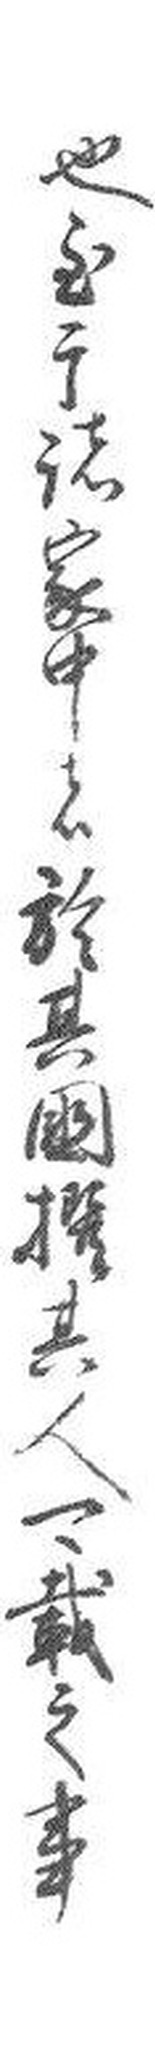也至于諸家中者於其国撰其人可載之事
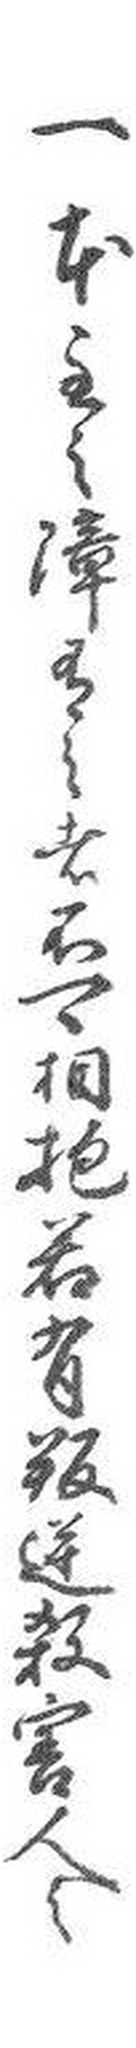一本主之障有之者不可相抱若有叛逆殺害人之
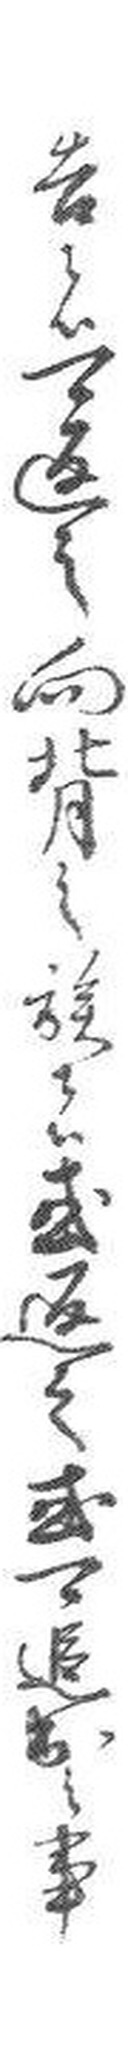告者可返之向背之族者或返之或可追出之事
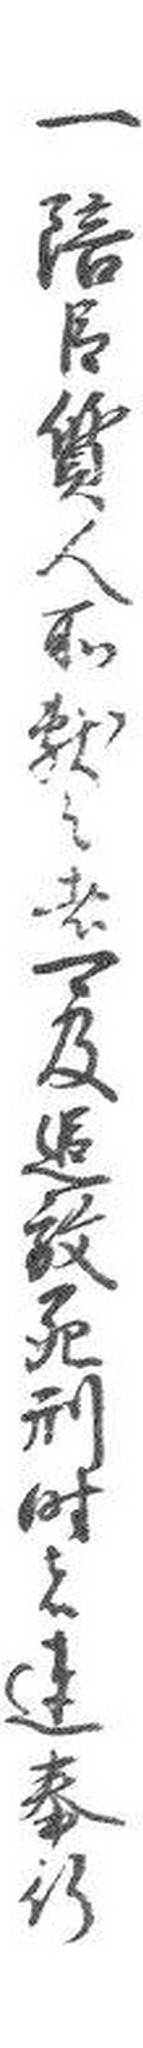一陪臣質人所献之者可及追放死刑時は達奉行
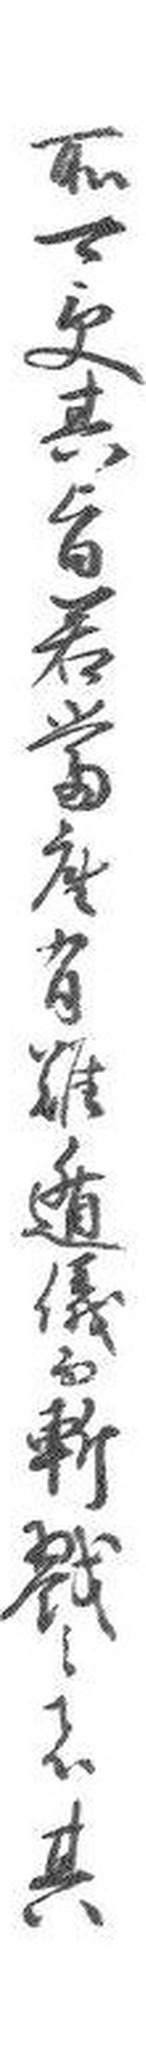所可受其旨若当座有難遁儀而斬戮之者其
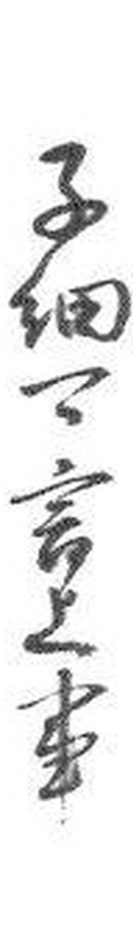子細可言上事
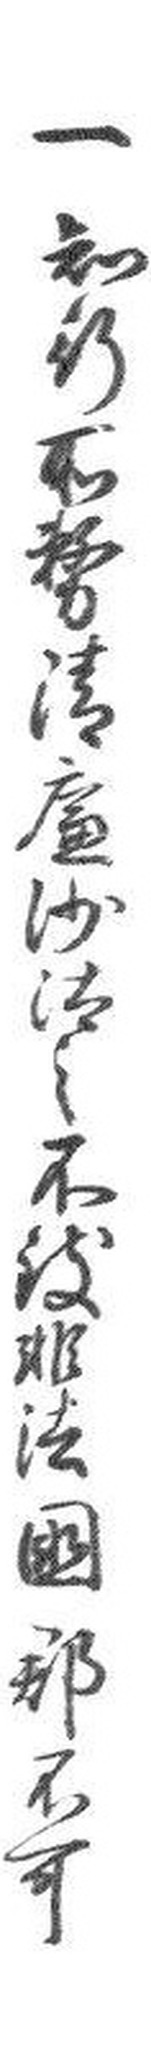一知行所務清廉沙汰之不致非法国郡不可
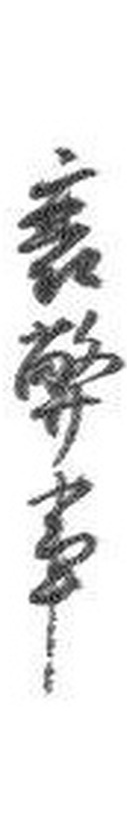衰弊事
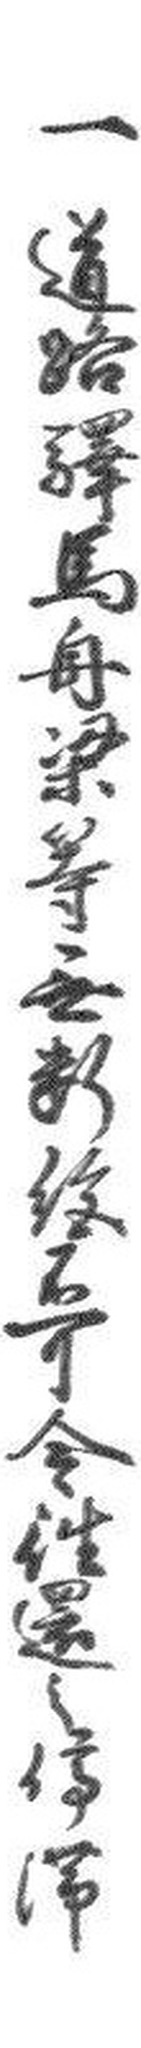一道路駅馬舟梁等無断絶不可令往還之停滞
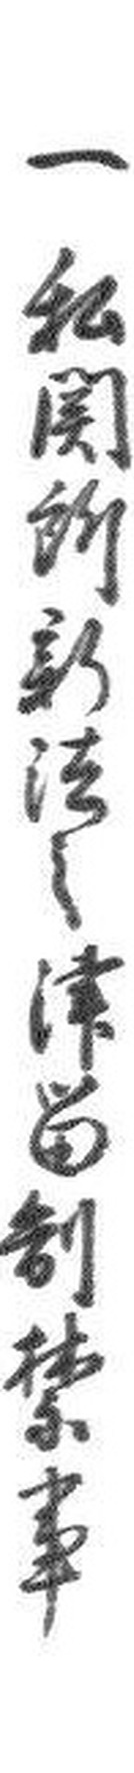一私関所新法之津留制禁事
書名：家譜 六 光通公 従万治三年到寛文三年
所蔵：福井県文書館 Fukui Prefectural Archives
